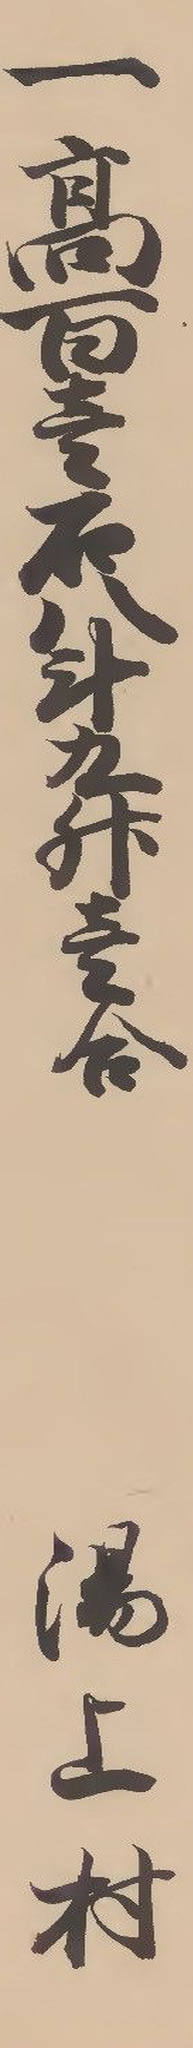一高百壱石八斗九升壱合湯上村
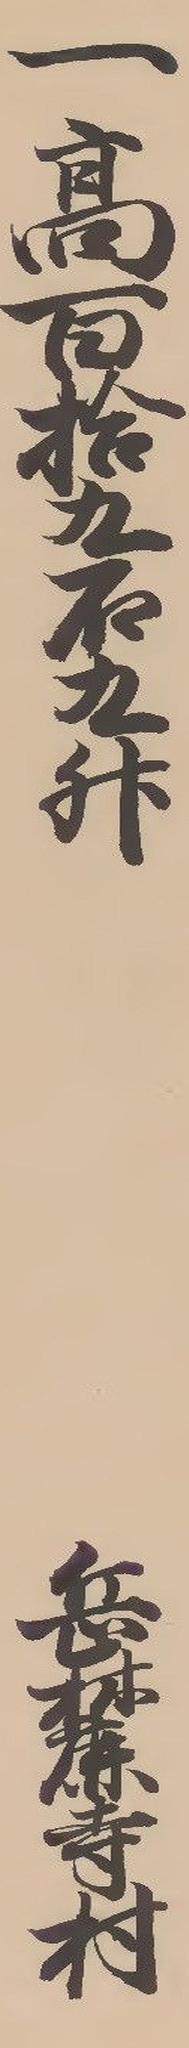一高百拾九石九升岳麓寺村

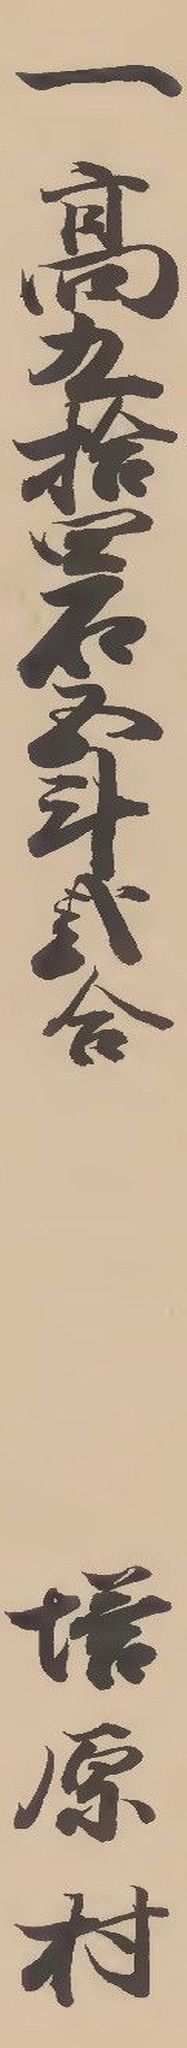一高九拾四石五斗弐合塔原村
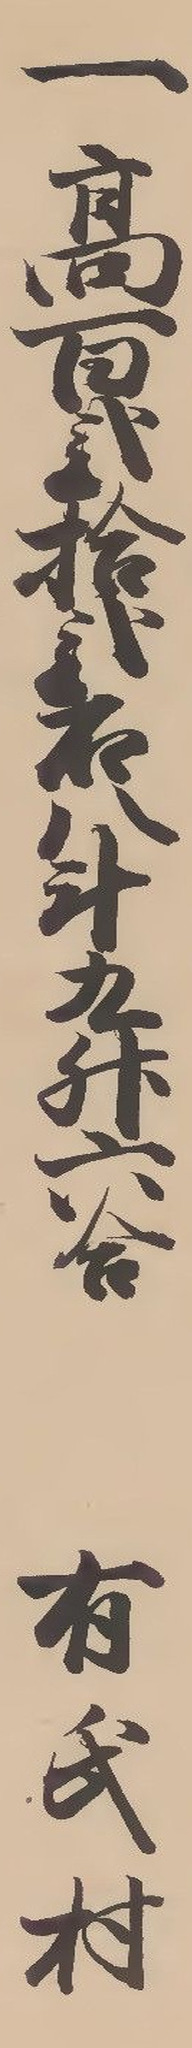一高百弐拾弐石八斗九升六合有氏村
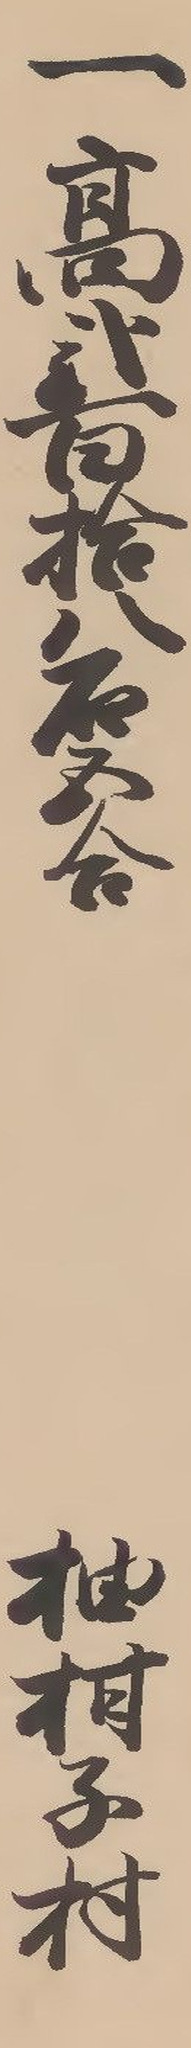一高弐百拾八石五合柚柑子村
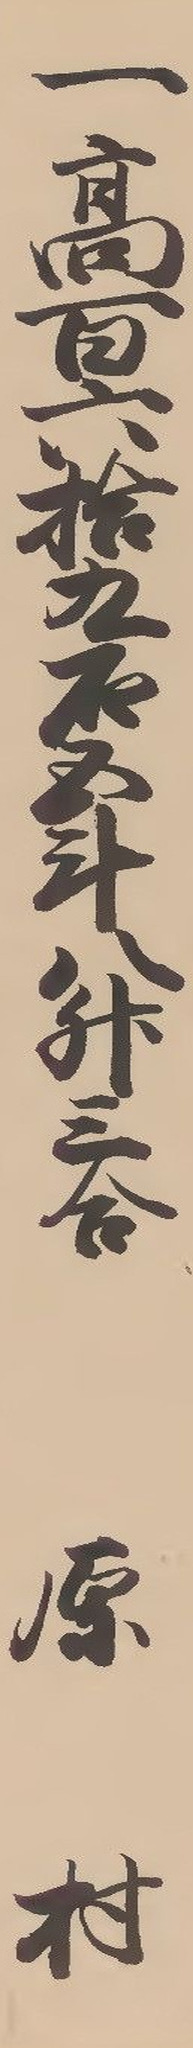一高百六拾九石五斗八升三合原村
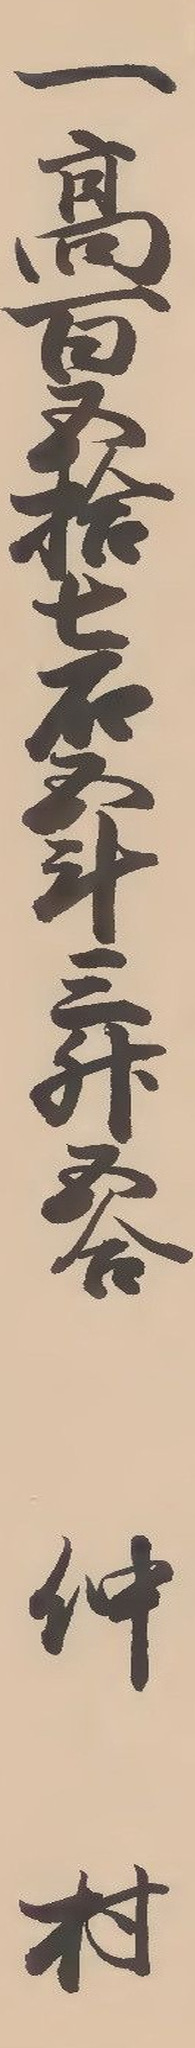一高百五拾七石五斗三升五合仲村
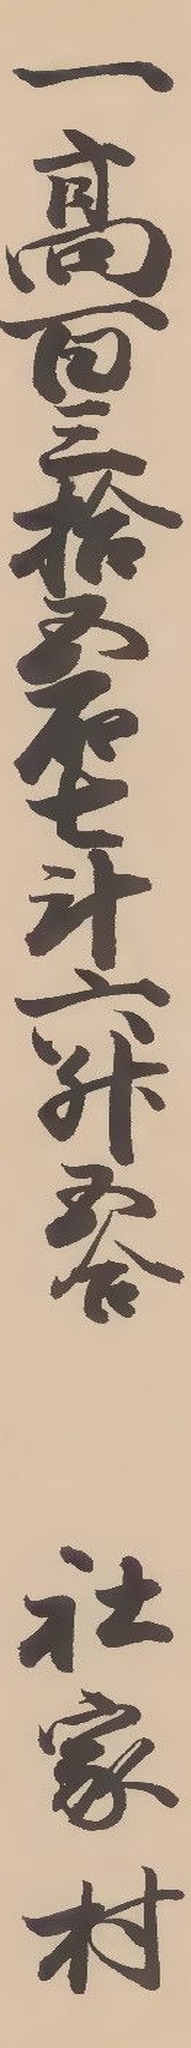一高百三拾五石七斗六升五合社家村
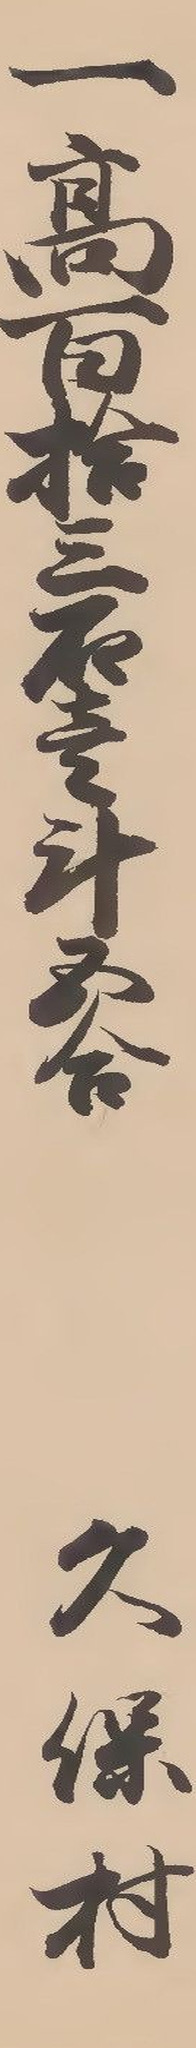一高百拾三石壱斗五合久保村
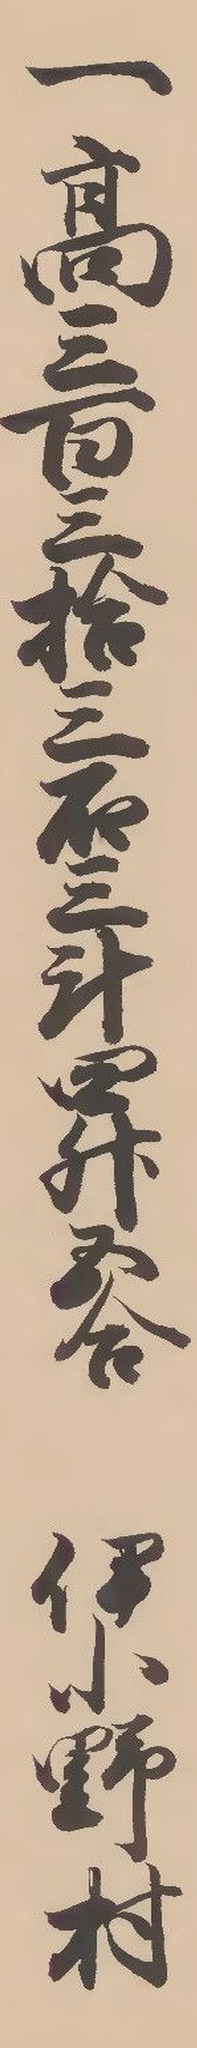一高三百三拾三石三斗四升五合伊小野村

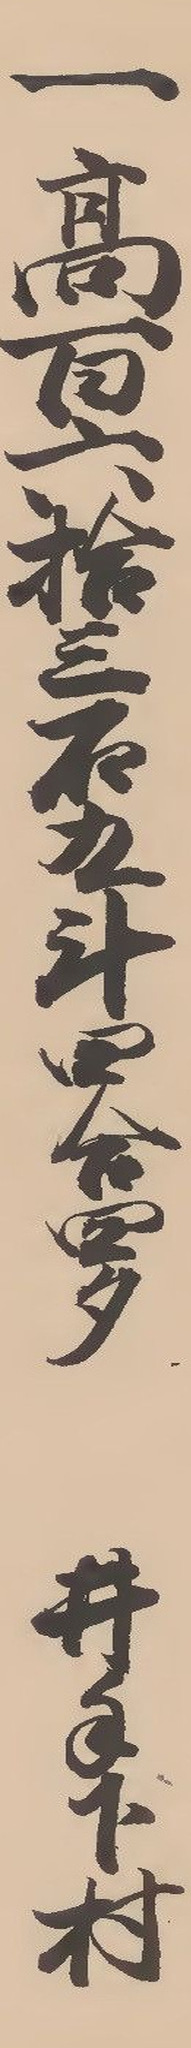一高百六拾三石九斗四合四勺井手下村
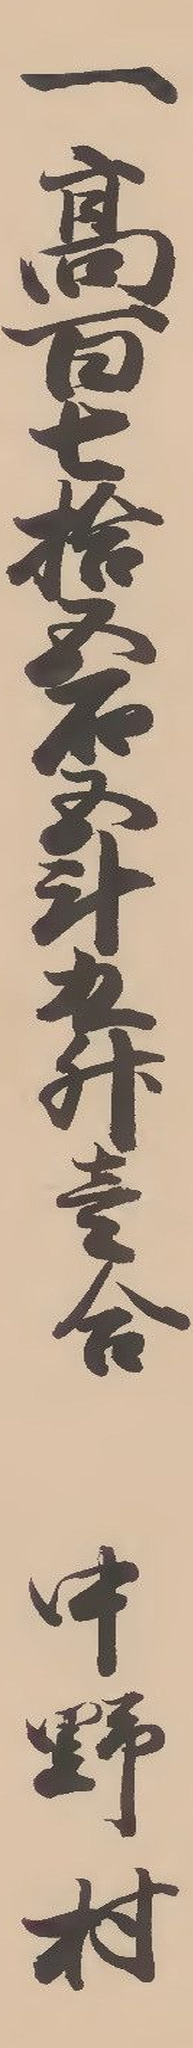一高百七拾五石五斗九升壱合中野村
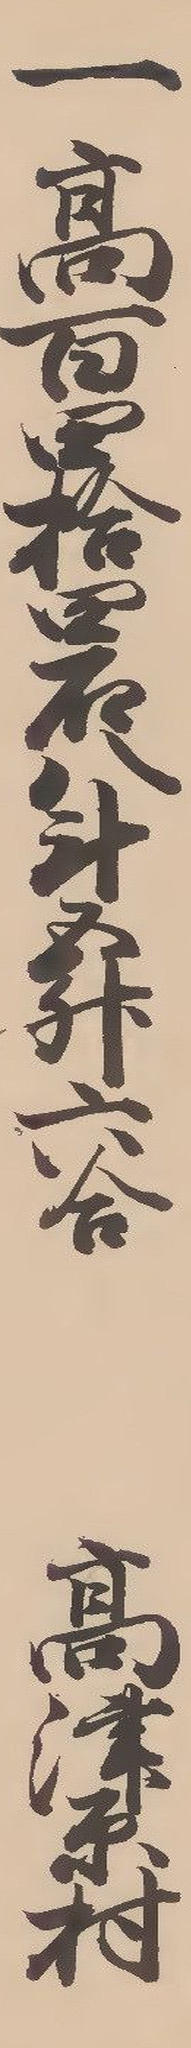一高百四拾四石八斗五升六合高津原村
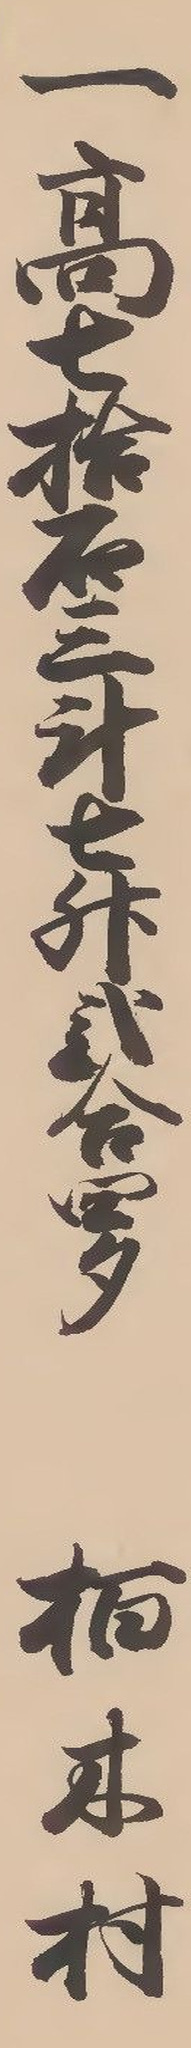一高七拾石三斗七升弐合四勺栢木村
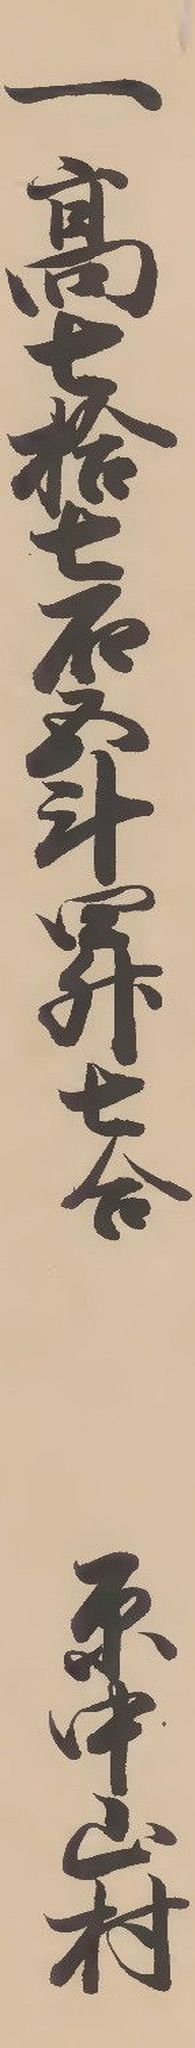一高七拾七石五斗四升七合原中山村
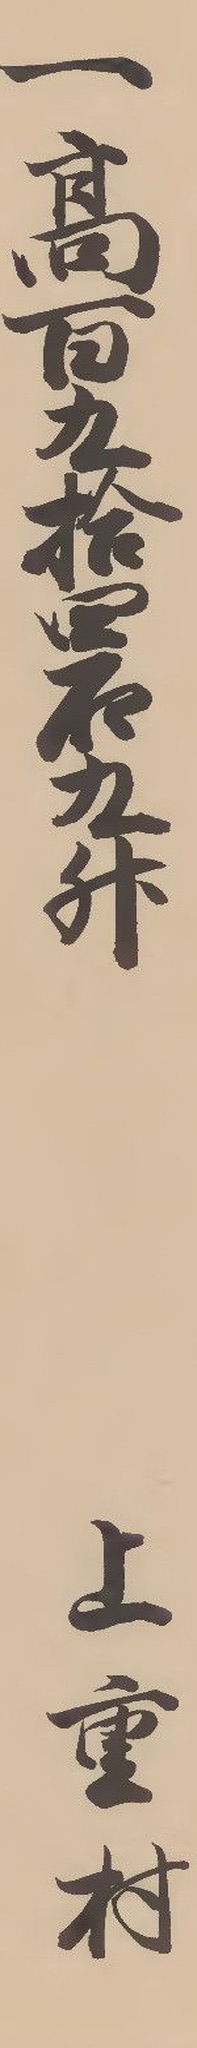一高百九拾四石九升上重村
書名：豊後国郷帳
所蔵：国立公文書館 National Archives of Japan
